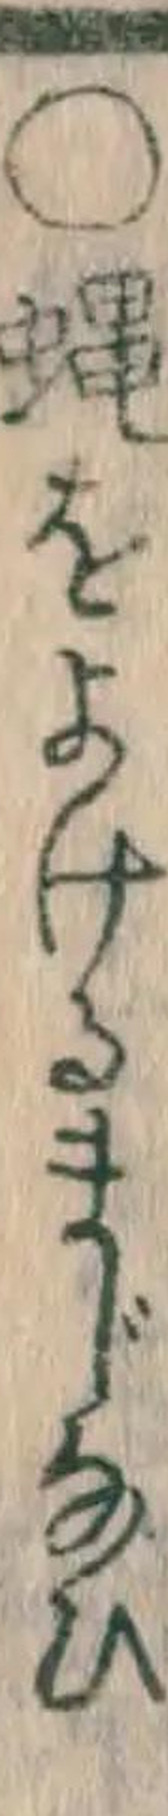○蝿をよけるまじなひ
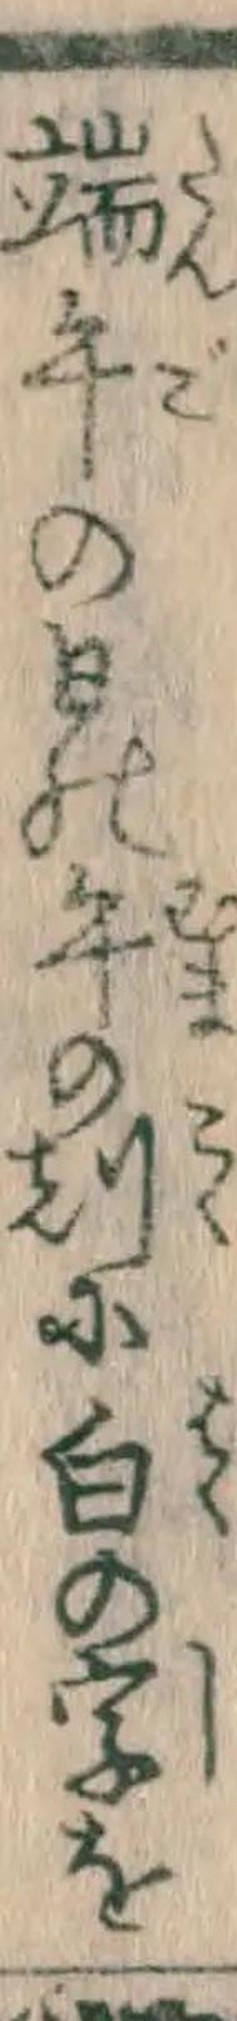端午の日の午の刻に白の字を
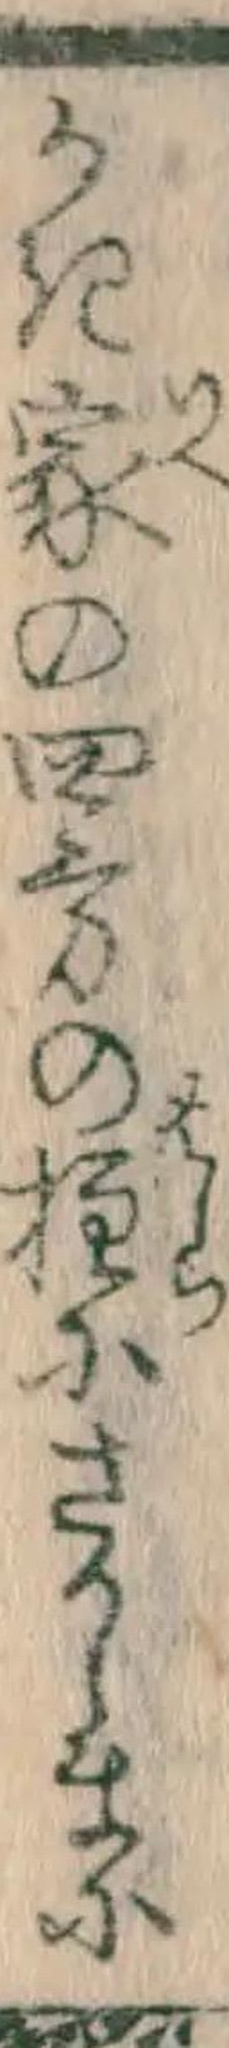かき家の四方の柱にさかしまに
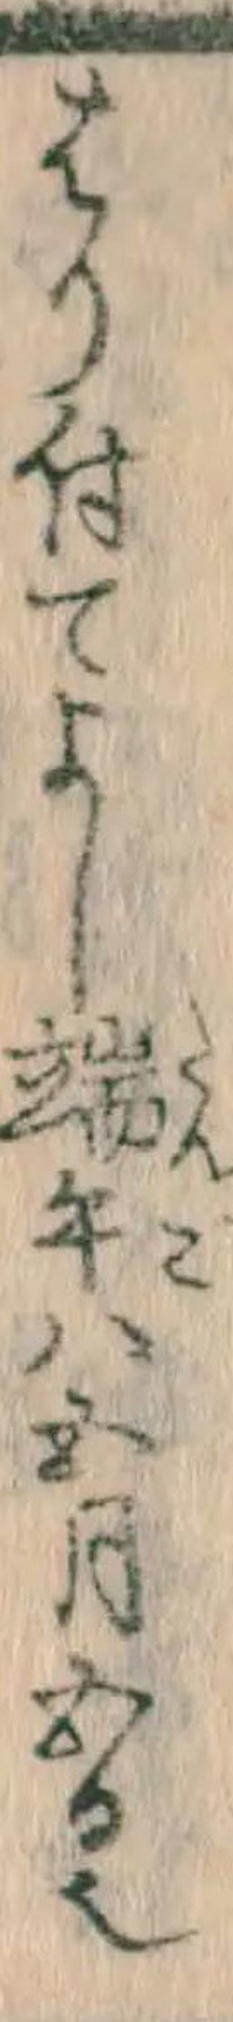はり付てよし端午は五月五日也
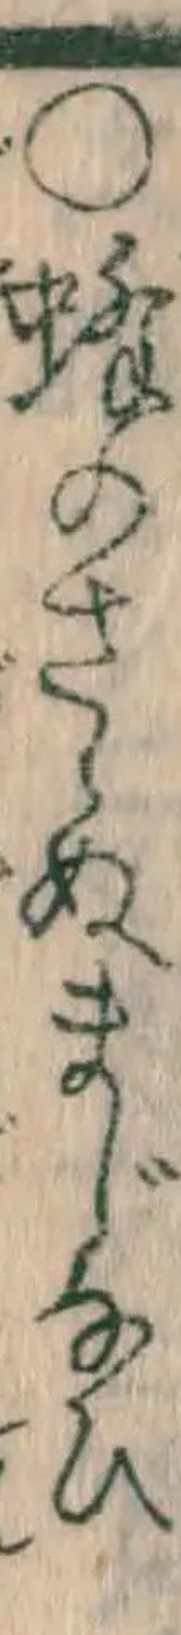○蜂のさゝぬまじなひ
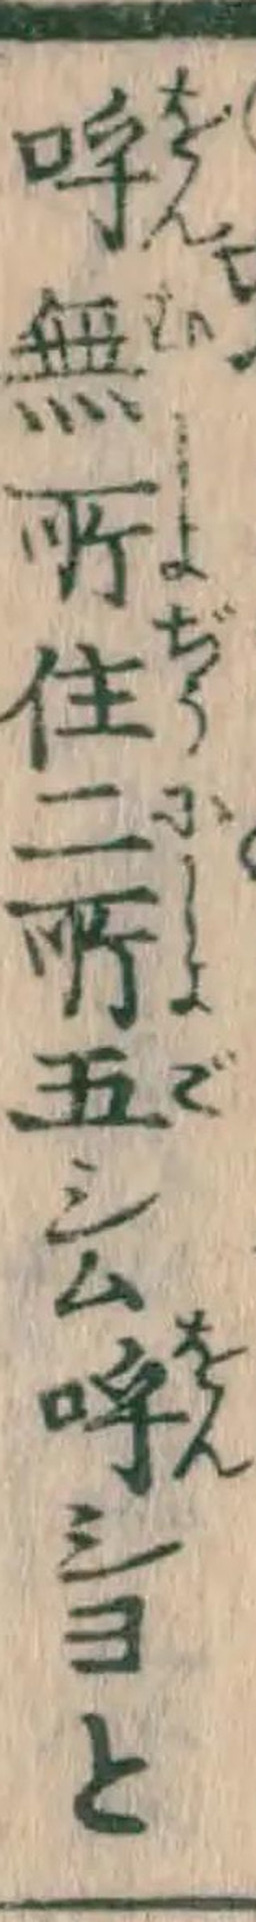呼無所住二所五シム呼シヨと
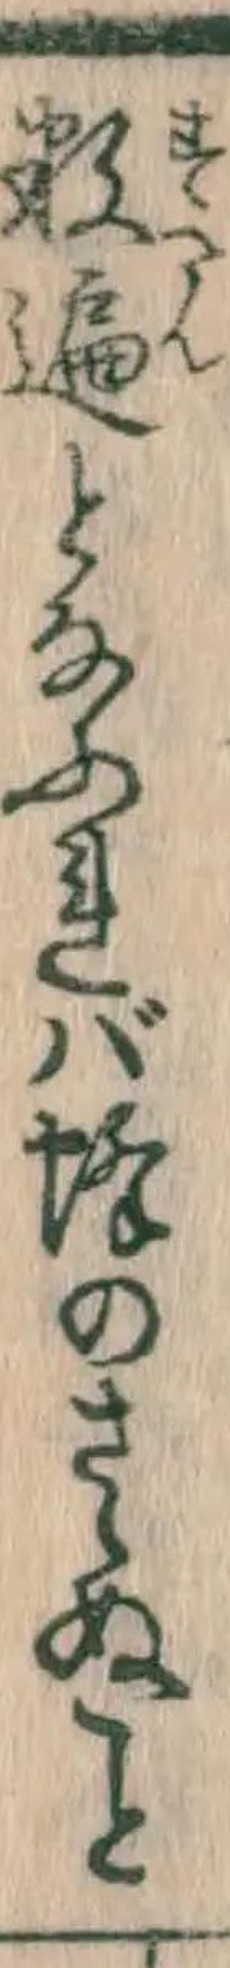数遍となふれば蜂のさゝぬこと
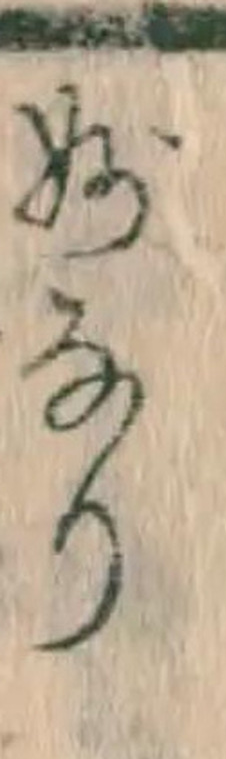妙なり
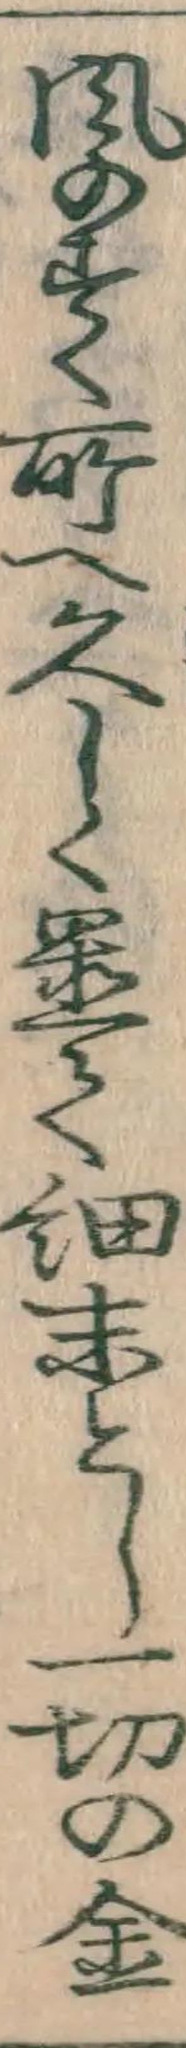風のすく所へ久しく置て細末とし一切の金
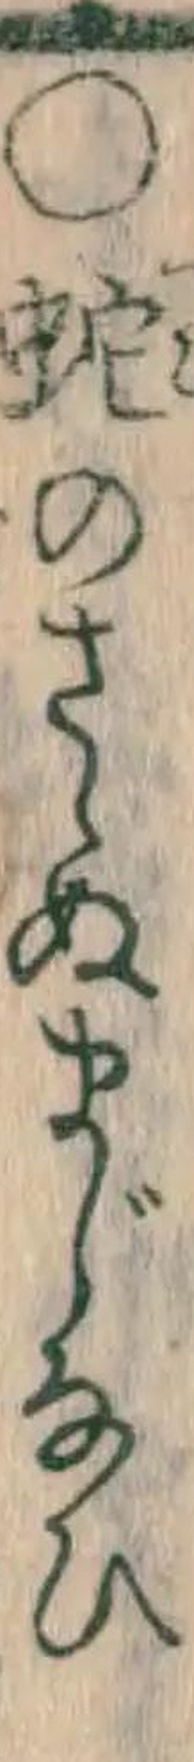○蛇のさゝぬまじなひ
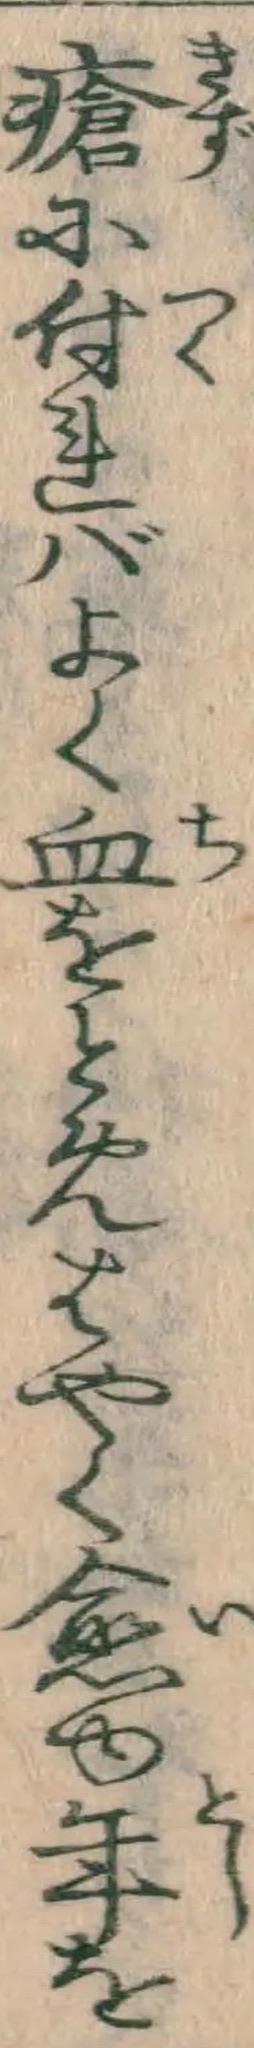瘡に付ればよく血をとめはやく愈ゆ年を
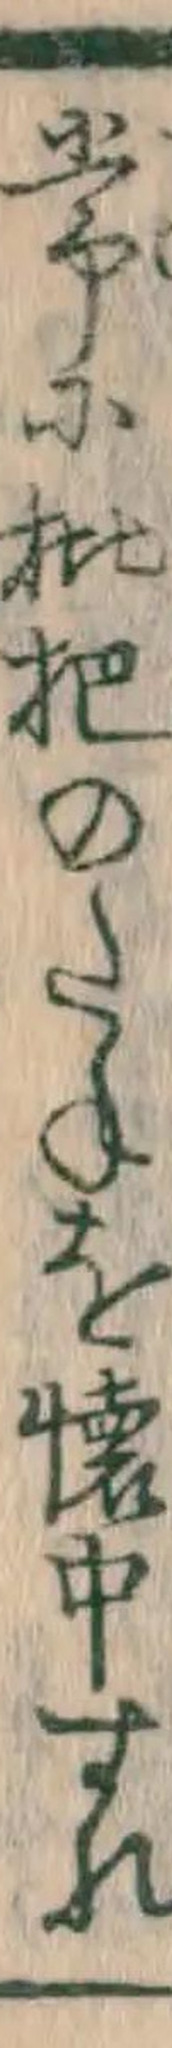常に枇杷のたねを懐中すれ
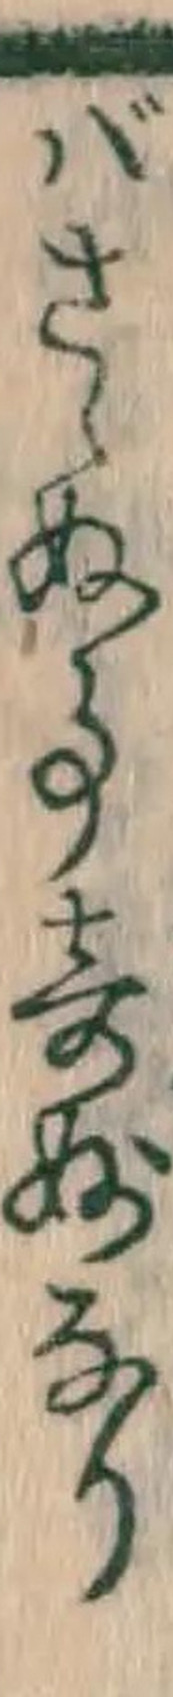ばさゝぬ事奇妙なり
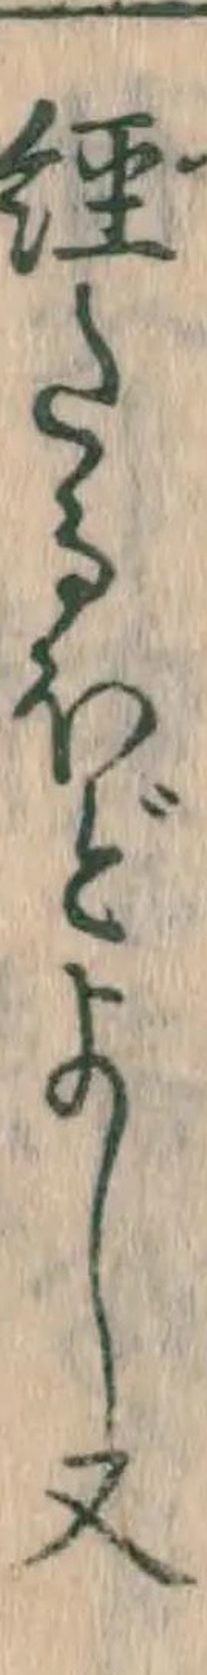経たるほどよし又
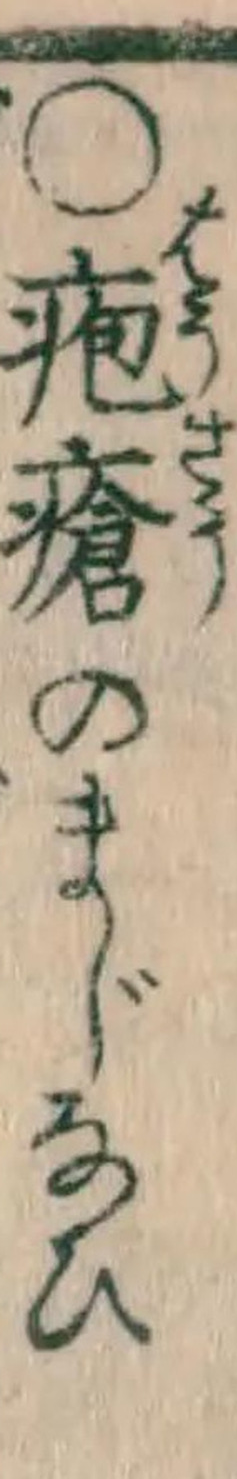○疱瘡のまじなひ
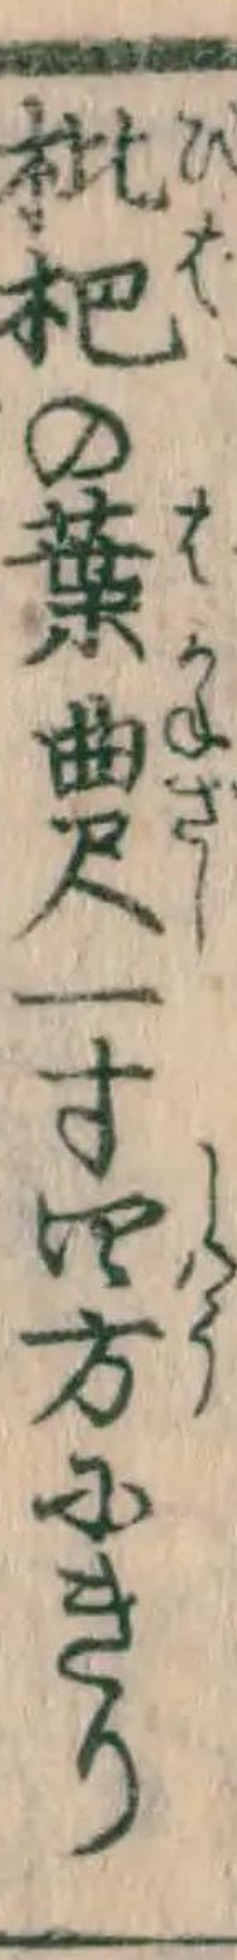枇杷の葉曲尺一寸四方にきり
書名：広益秘事大全 3巻. [4]
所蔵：国立国会図書館 National Diet Library, JAPAN
